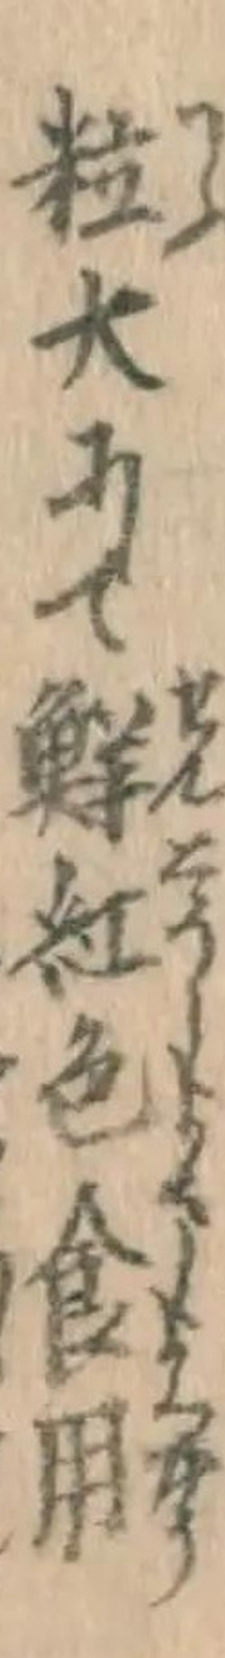粒大にして鮮紅色食用
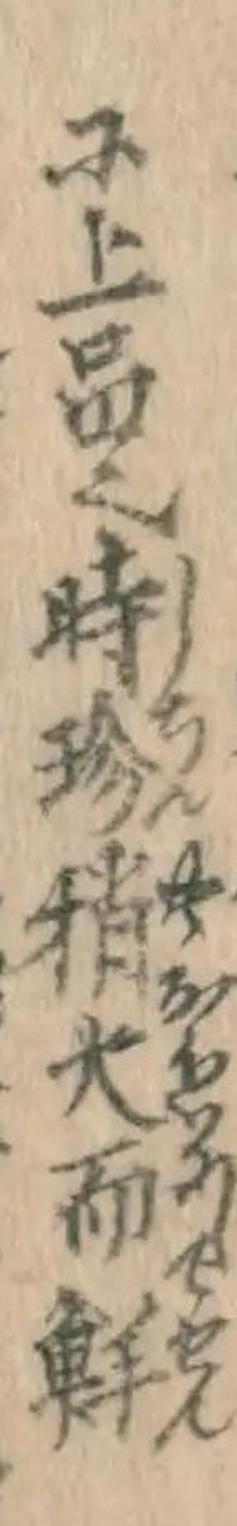に上品也時珍稍大而鮮
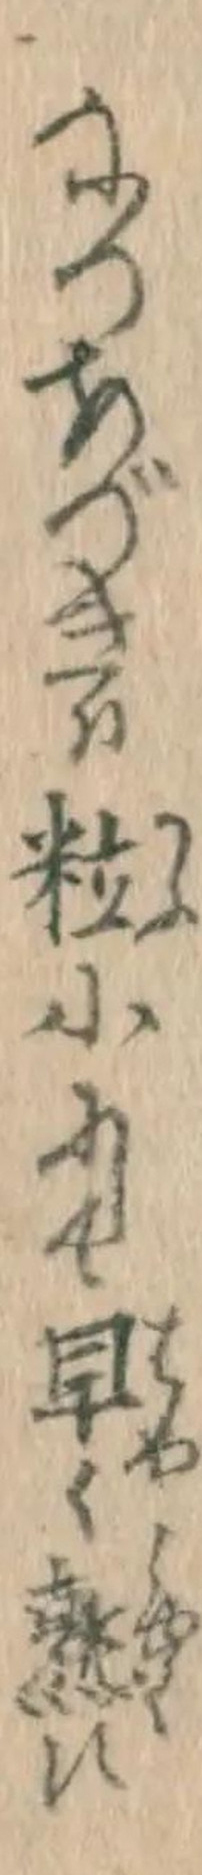なつあづきは粒小にして早く熟す
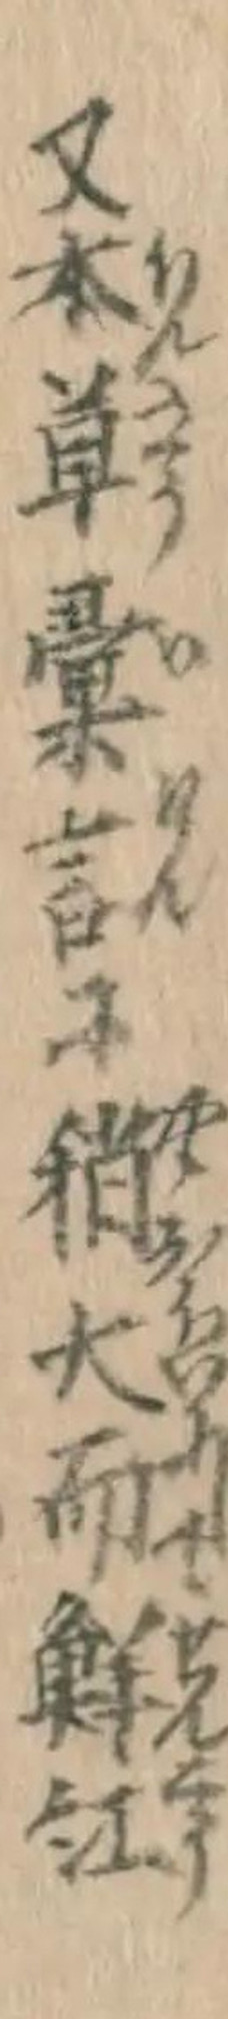又本草彙言に稍大而鮮紅
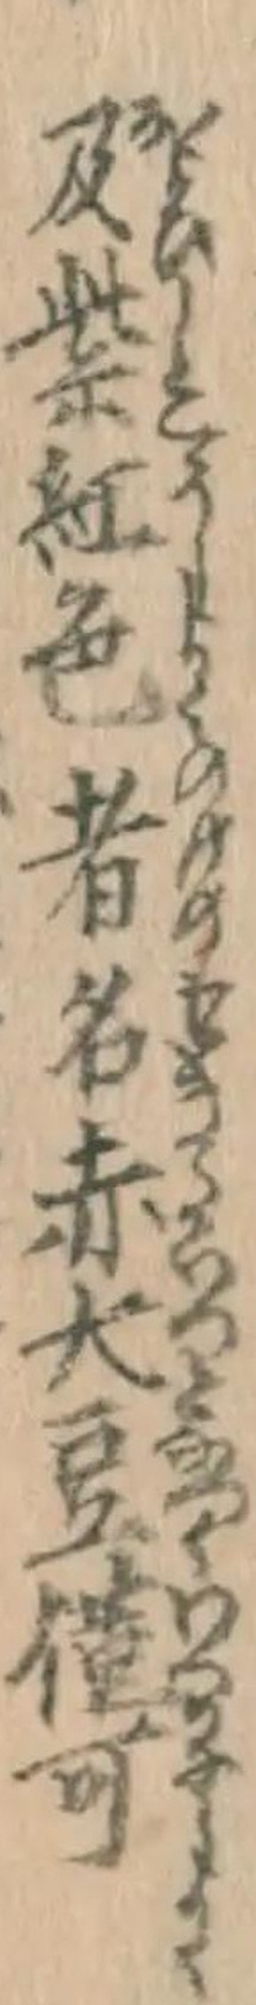及紫紅色者名赤大豆僅可
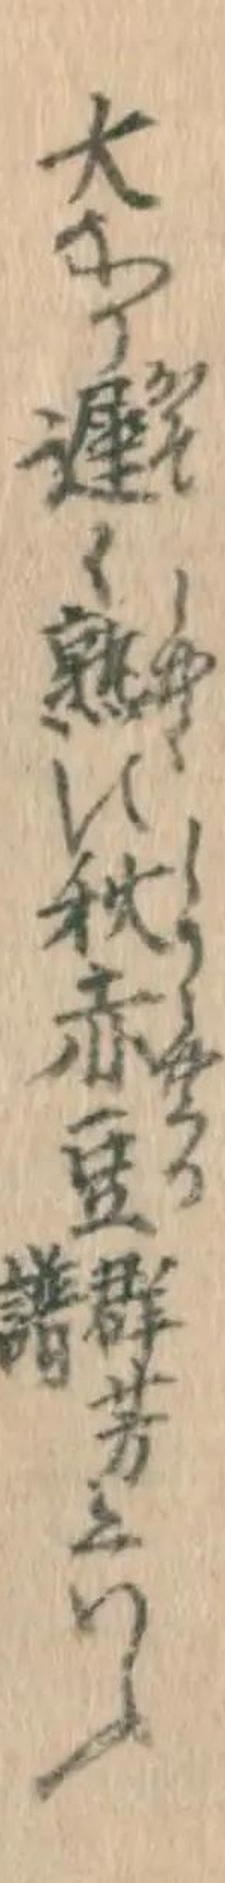大なり遅く熟す秋赤豆群芳譜といふ
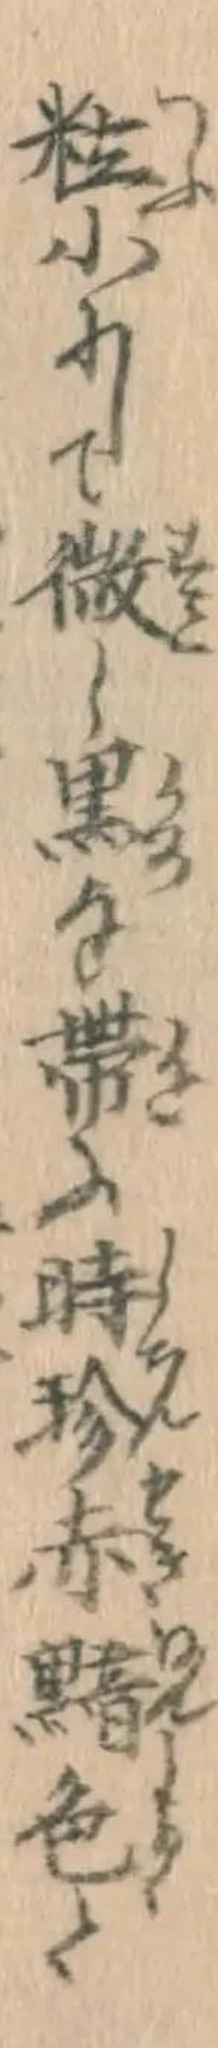粒小にして微し黒を帯ふ時珍赤黯色と
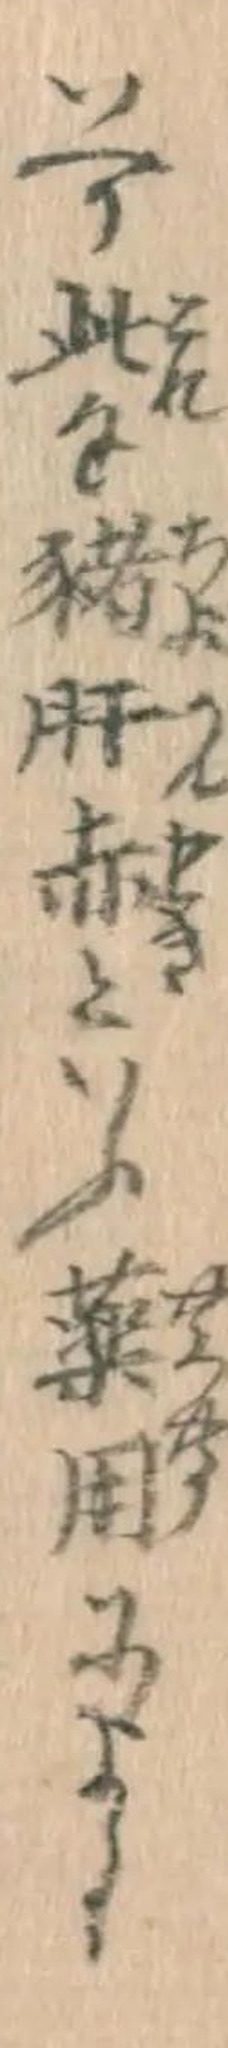いへり此を猪肝赤といふ薬用によし
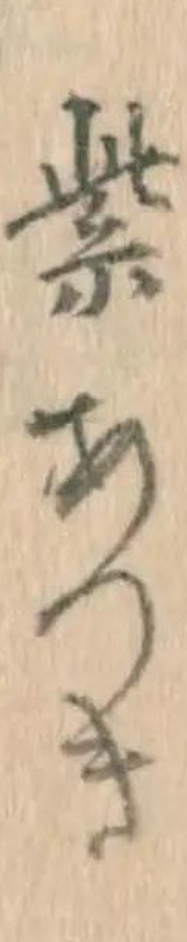紫あつき
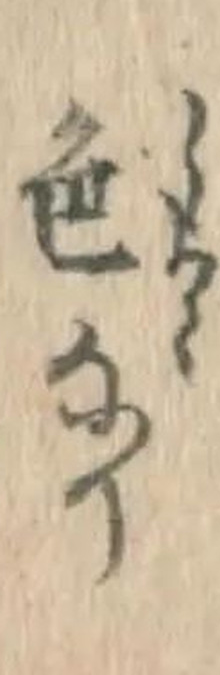色なり

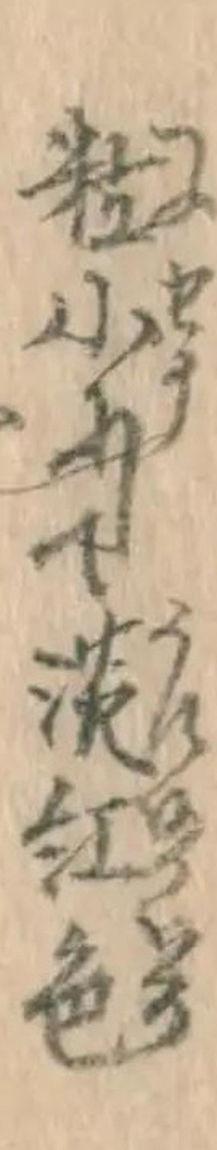粒小にして淡紅色
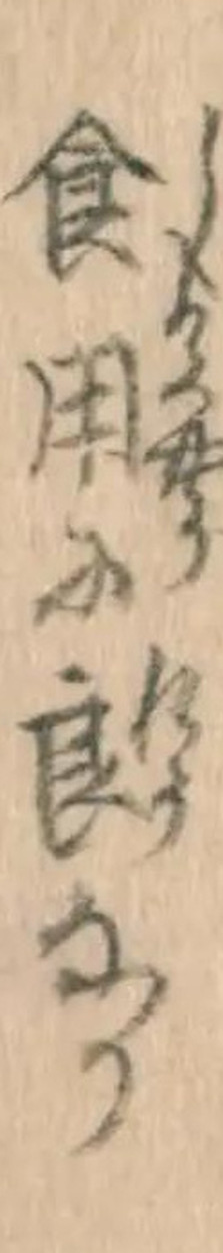食用に良なり
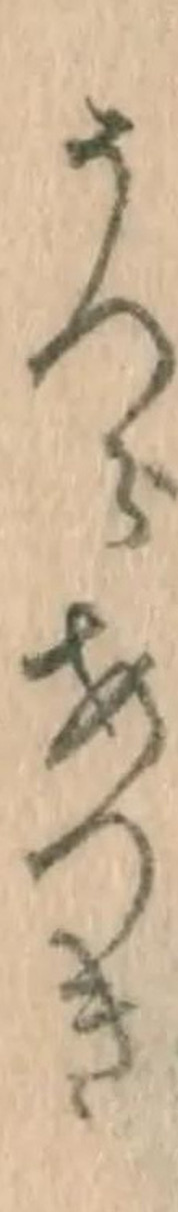うつらあつき
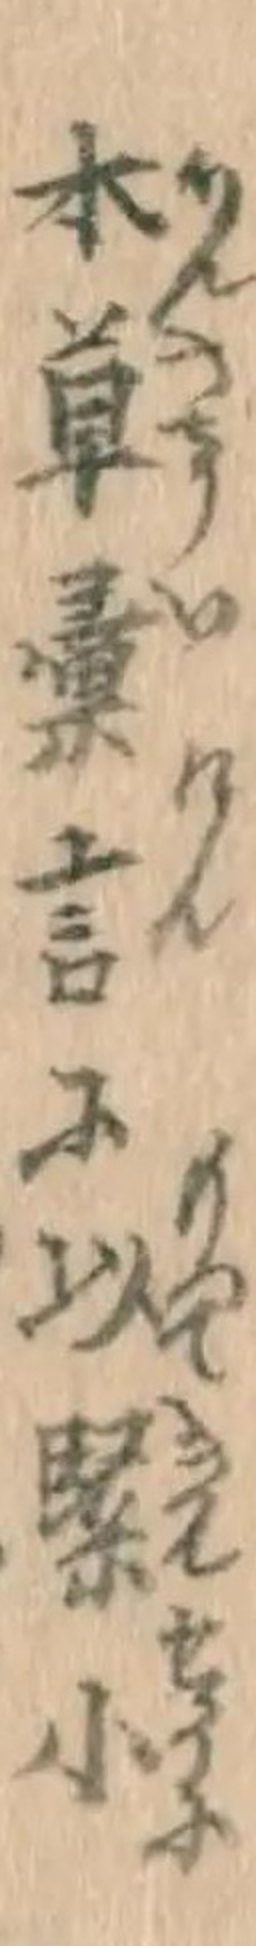本草彙言に以緊小
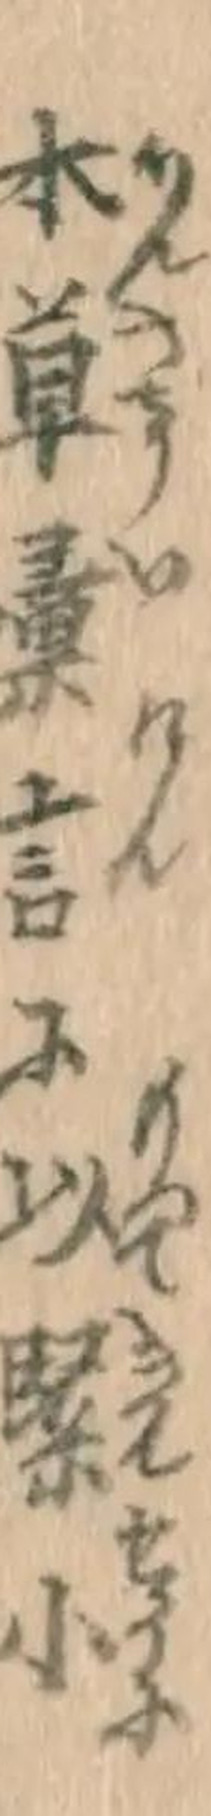本草彙言に以緊小
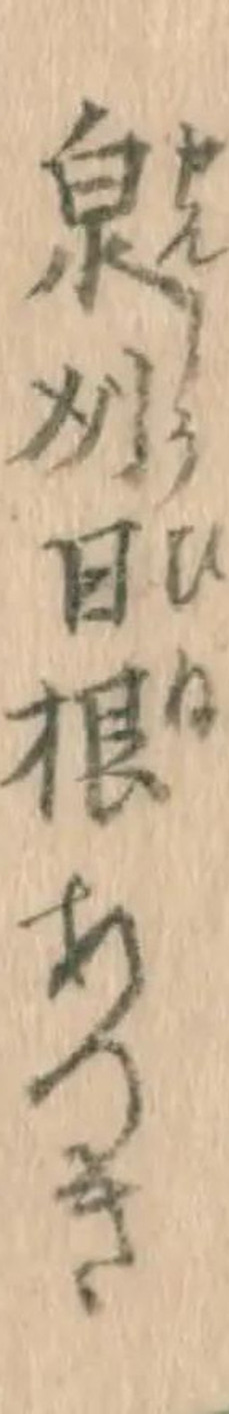泉州日根あつき
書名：本草図譜. 巻43-45
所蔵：国立国会図書館 National Diet Library, JAPAN
